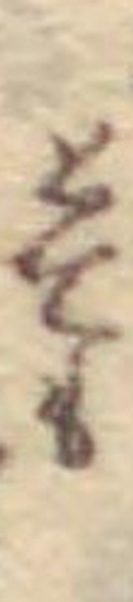とても
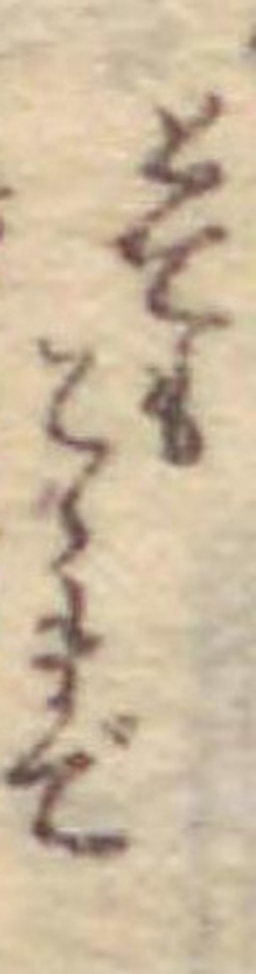こゝまで
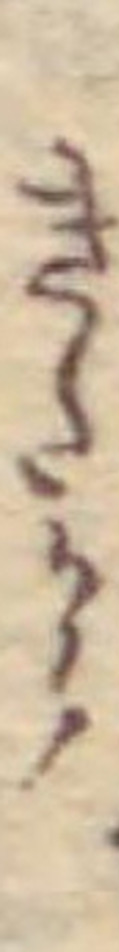きたから
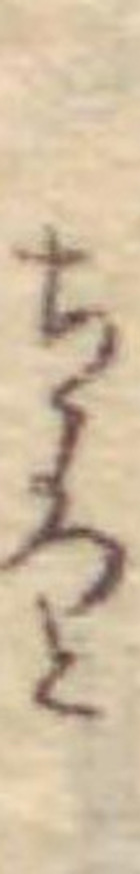ちよつと
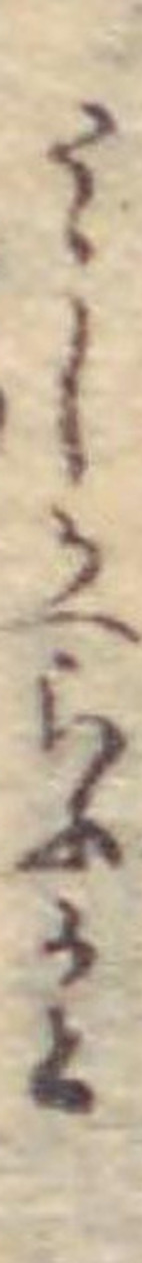そ？しかへらふかと
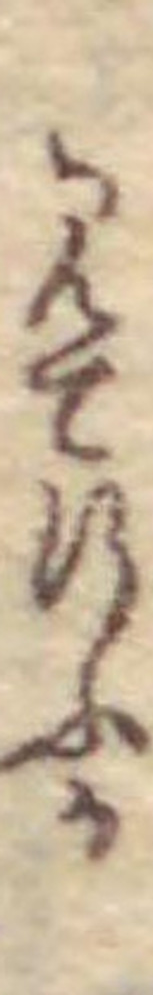見て行ふか
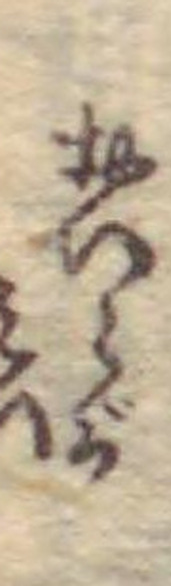おいらが
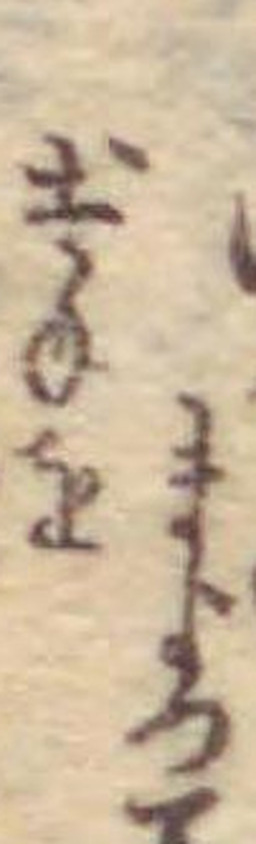土手を
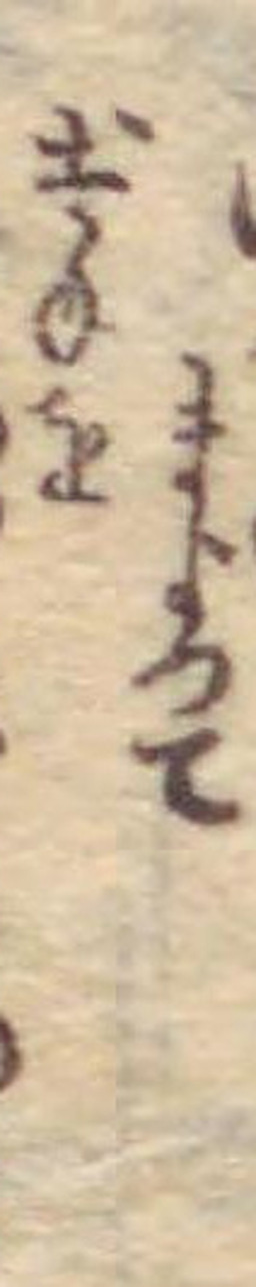土手を
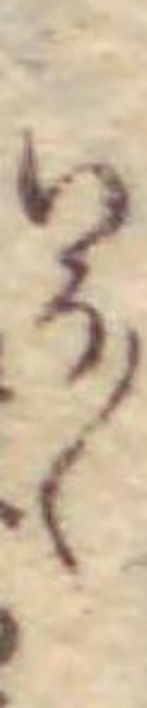いろ〳〵
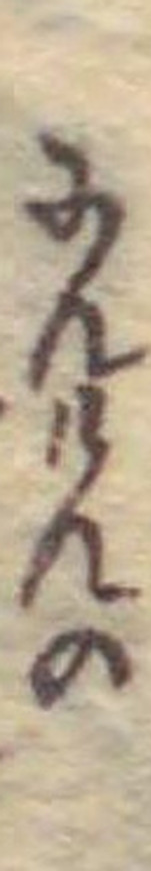にんけんの
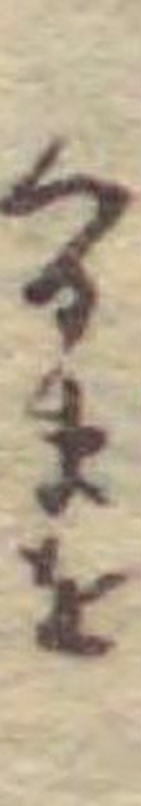くるまを
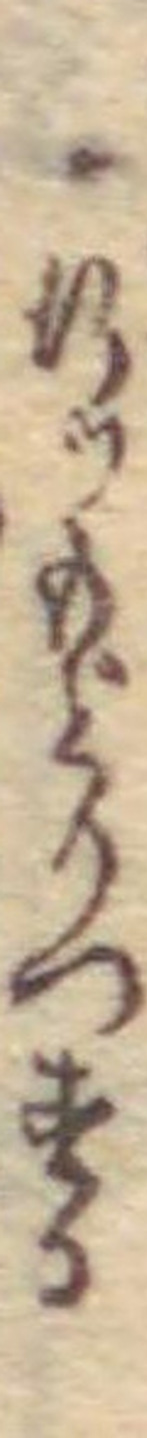行つもどりつする
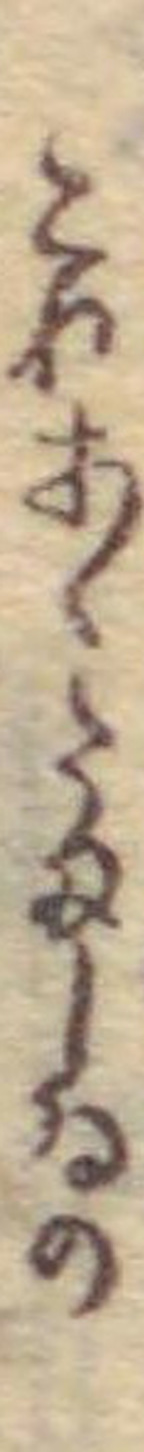これあくたましゐの
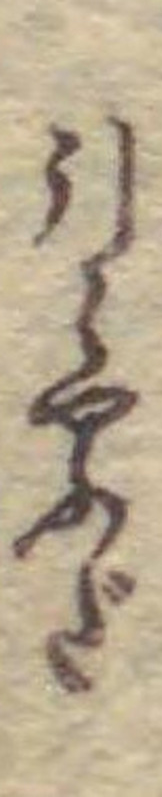引くやふだ
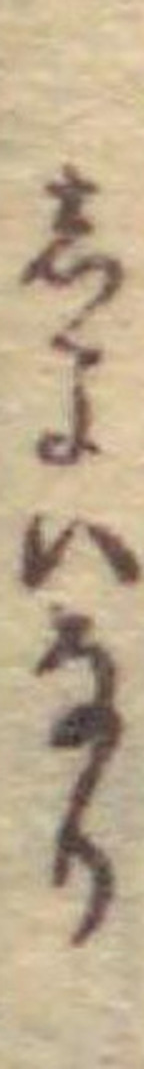しよいなり
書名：心学早染艸 : 3巻
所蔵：国立国会図書館 National Diet Library, JAPAN
